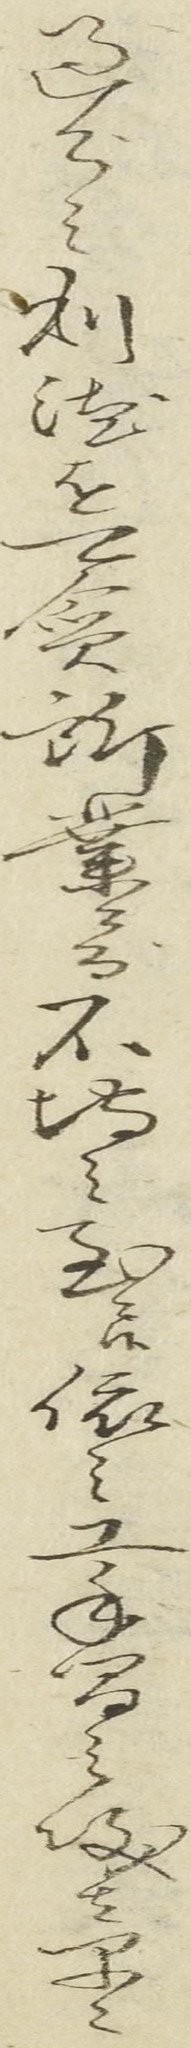過分之判読を可貪所業ニ而不埒之至ニ候依之工手間之儀は早々
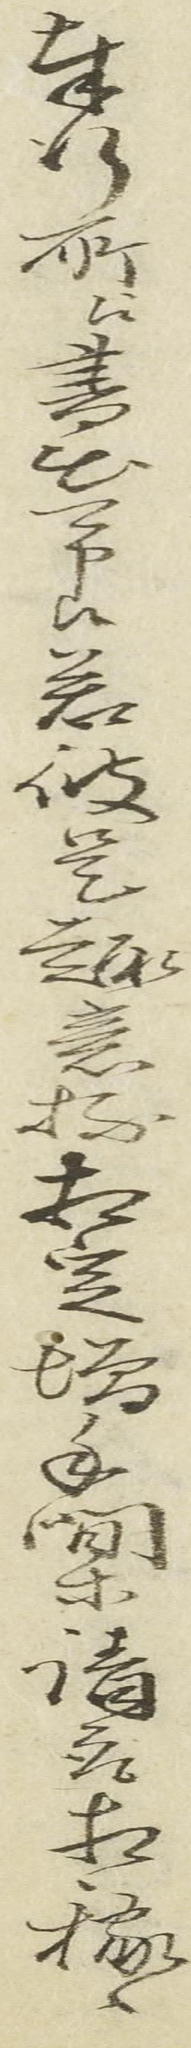奉行所え書出可申候若彼是趣意抔相定増手間等請取相稼候
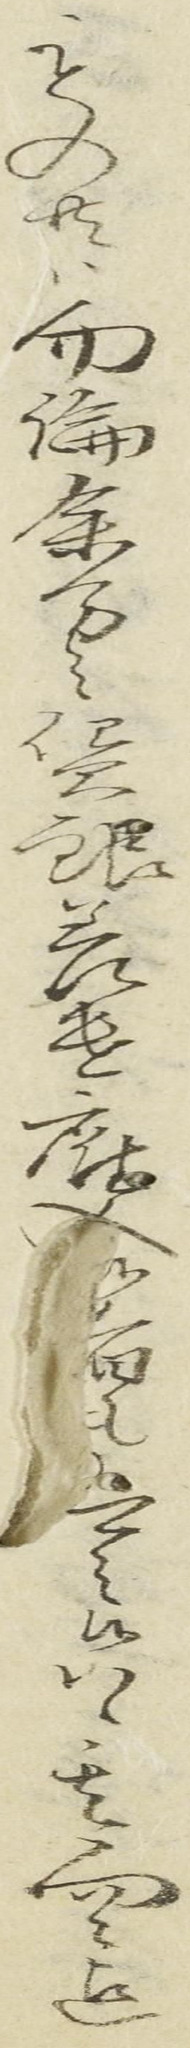もの共ハ勿論余分之賃金差遣府？入候も有之候ハゝ其向々迄
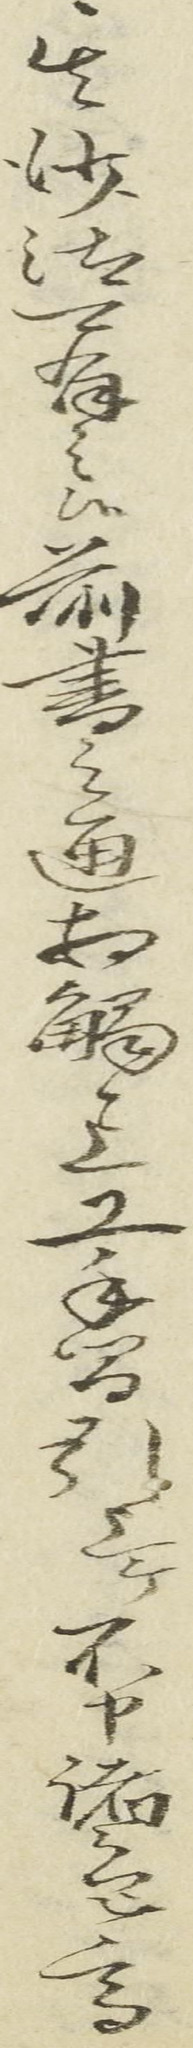其沙汰可有之候前書之通相触候上工手間引上ケ不申諸色高
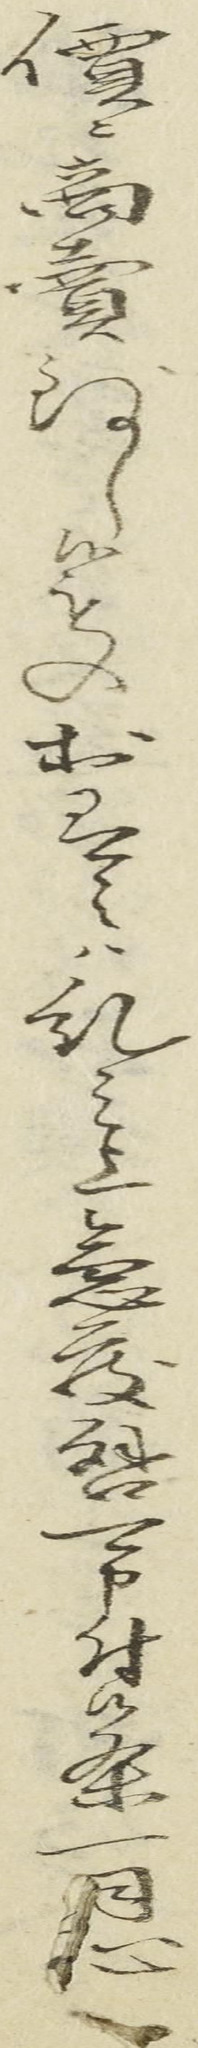価ニ商売致し候もの於有之ハ糺之上急度咎可申付候条一同心
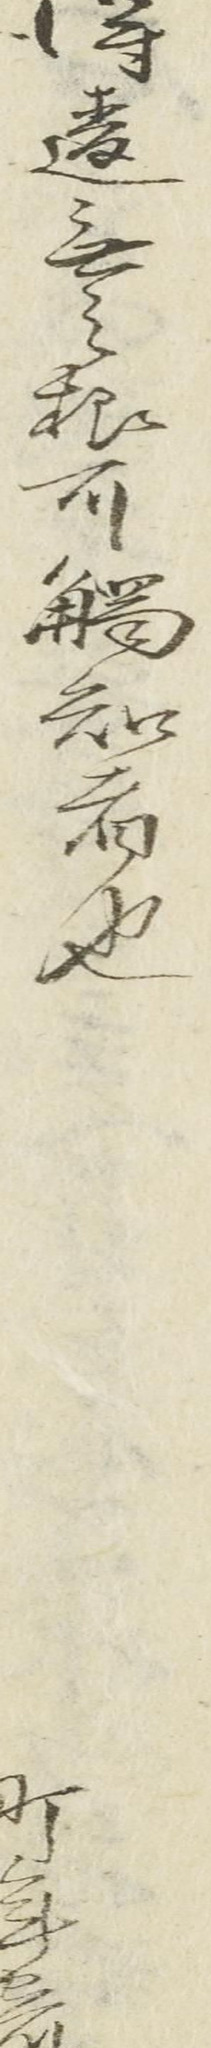得違無之様可触知者也町年寄
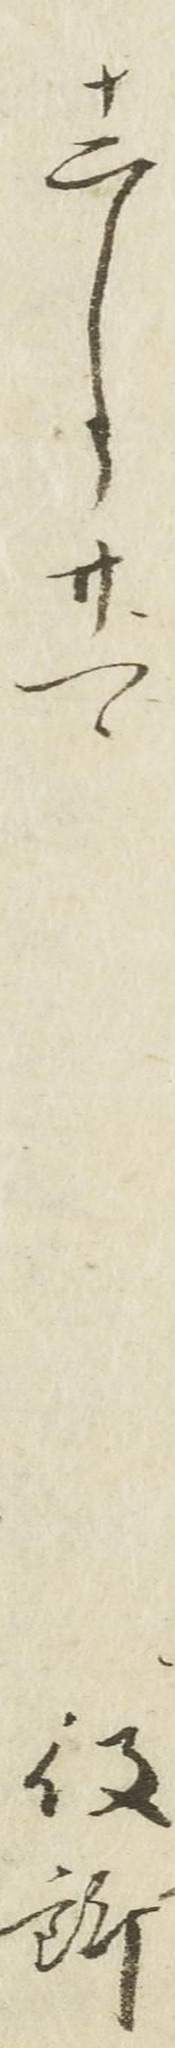十二月廿一日役所
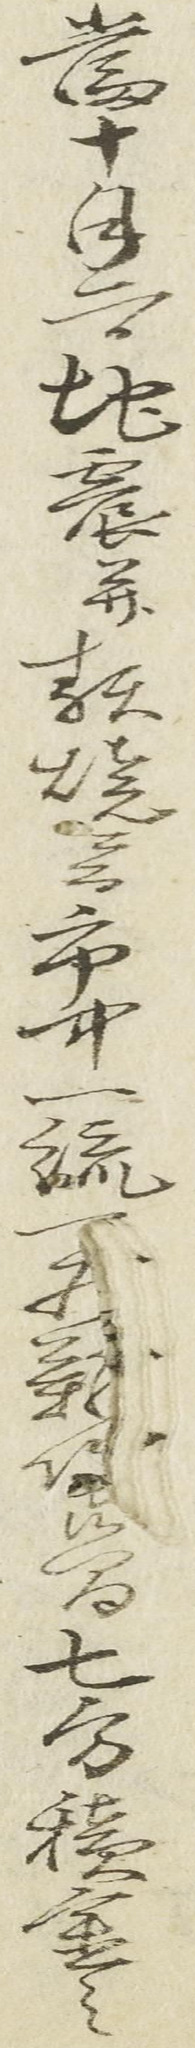当十月二日地震幷類焼ニ而市中一統為難儀候間七分積金之
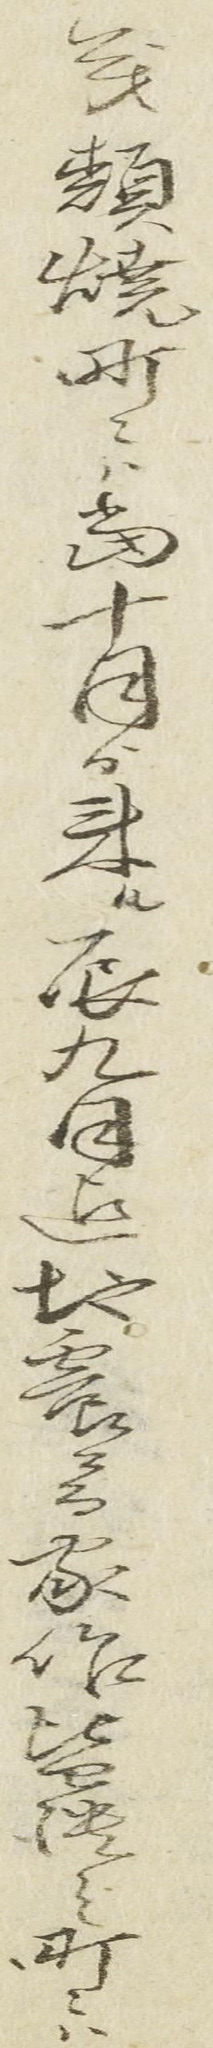義類焼町々ハ当十月ゟ来ル辰九月迄地震ニ而家作皆潰之町々ハ
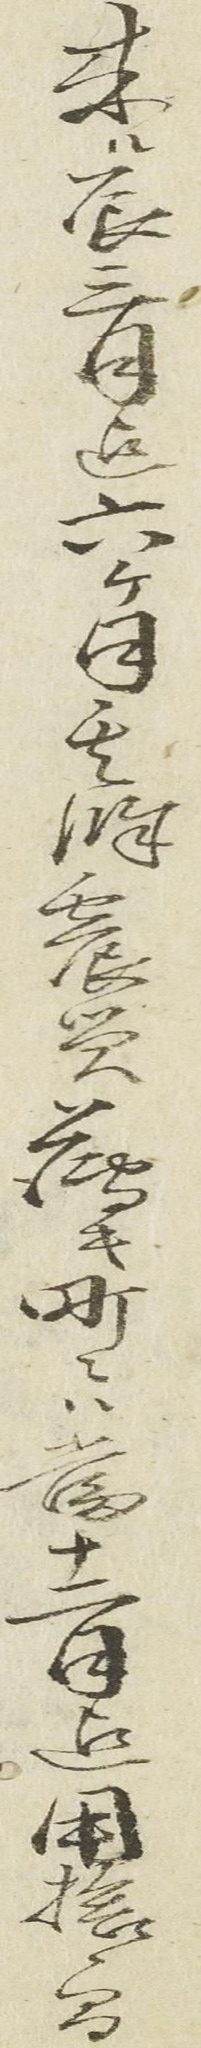来ル辰三月迄六ヶ月其余震災薄キ町々ハ当十二月迄用捨候間
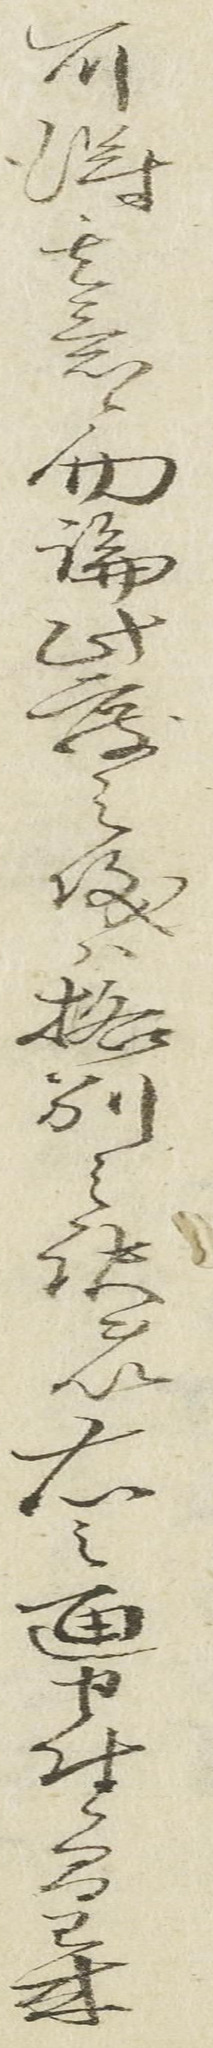可得其意候勿論今度之儀ハ格別之訳ヲ以右之通申付候間已来
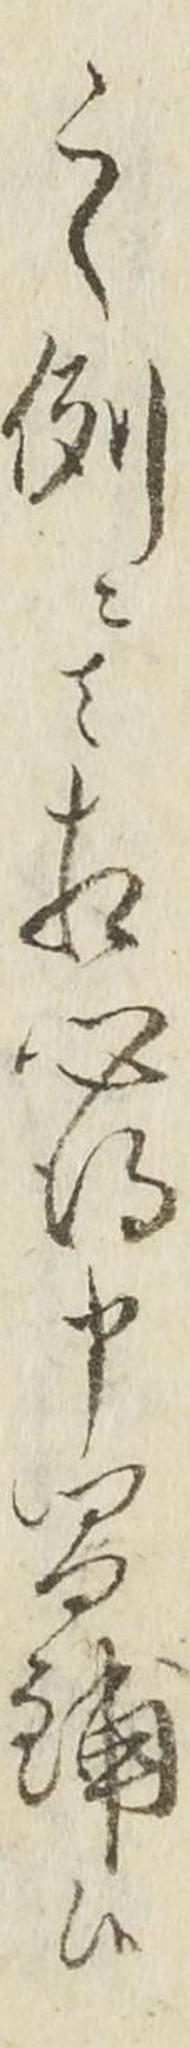之例ニは相心得申す間鋪候
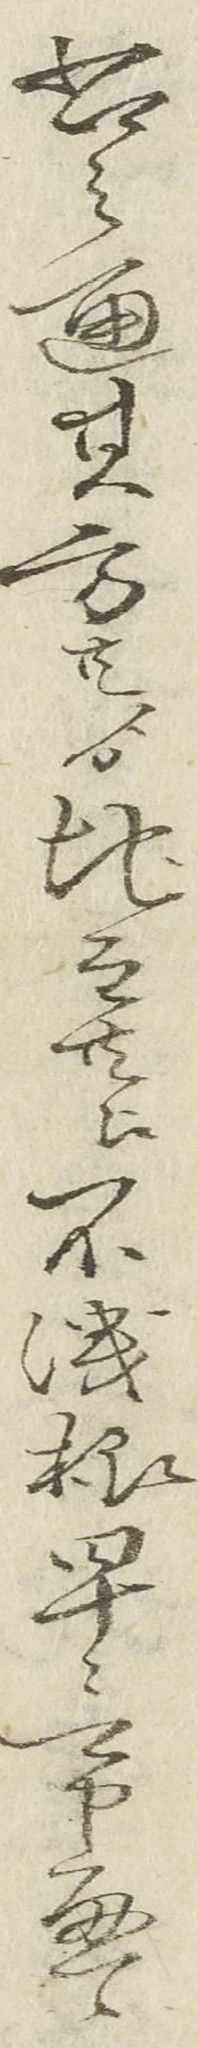右之通其方共ゟ地主共え不洩様早々可申通候
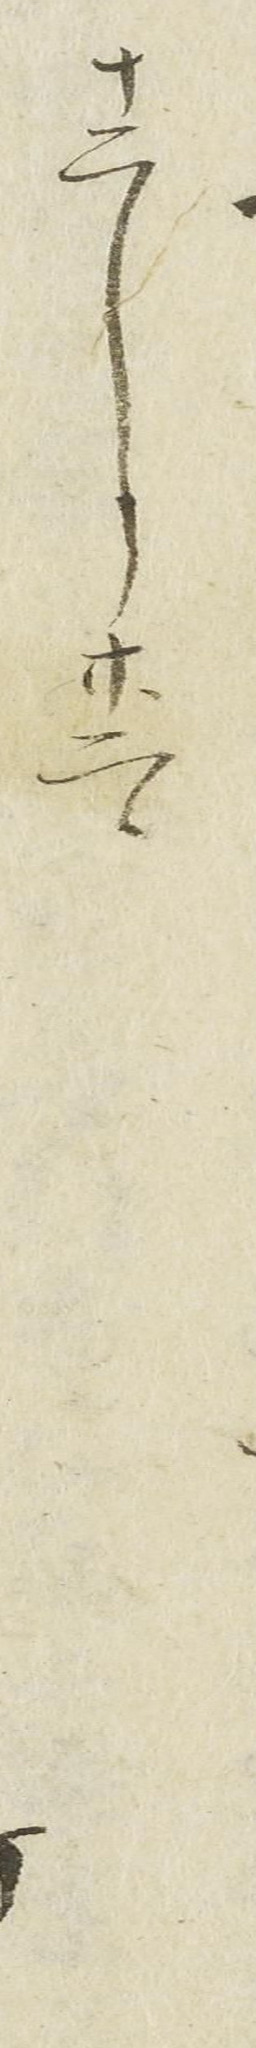十二月廿二日町々
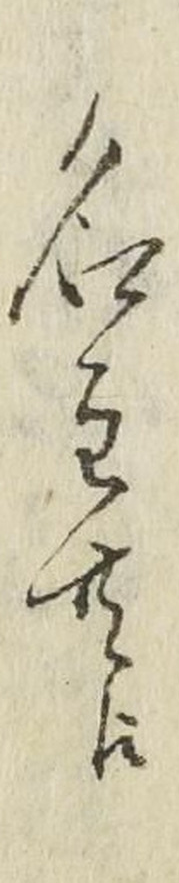名主共え
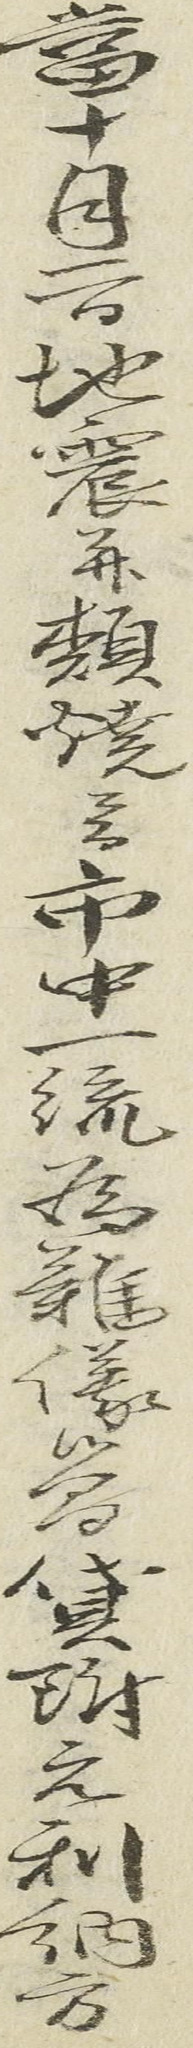当十月二日地震幷類焼ニ而市中一統為難儀候間貸付元利納方
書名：安政二乙卯年十月二日大地震之事
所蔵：東京大学地震研究所図書室 Earthquake Research Institute Library, The University of Tokyo, JAPAN
